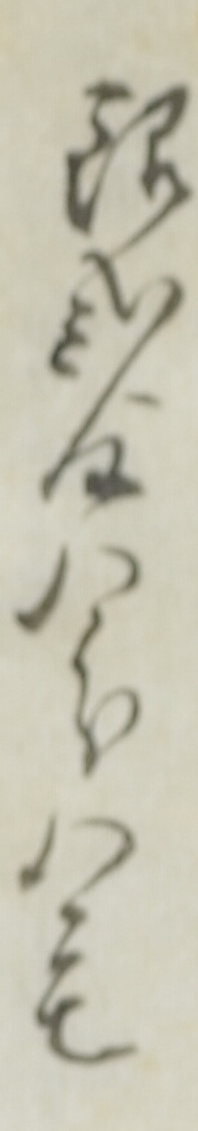銀弐匁八分八朱
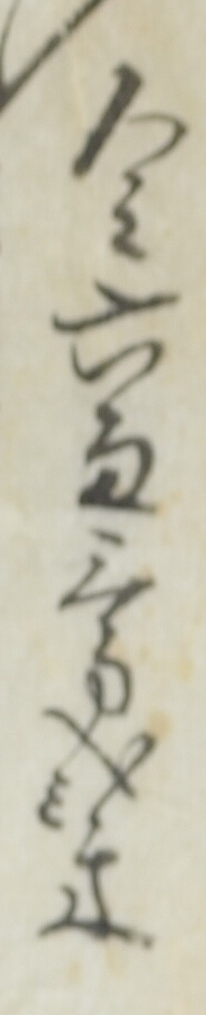〆金六両三分弐朱
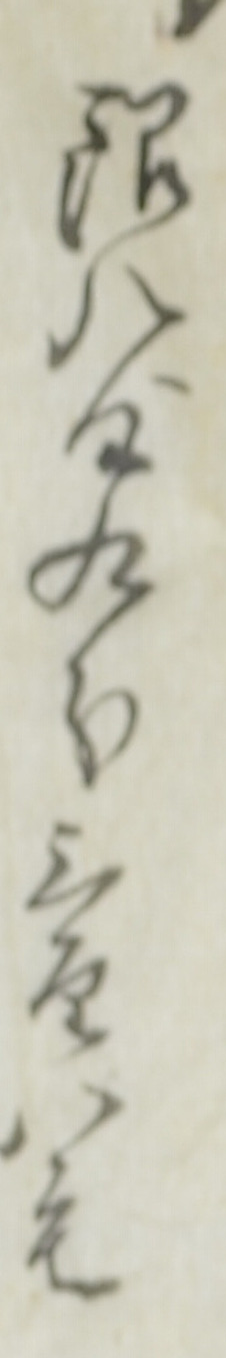銀八匁九分三里三毛
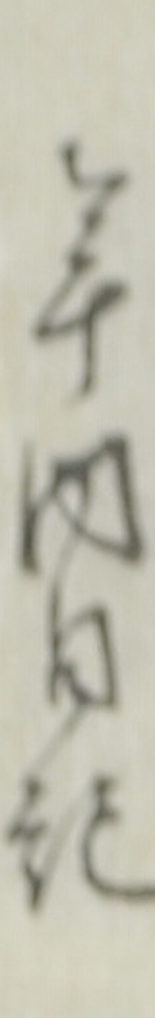年内日記
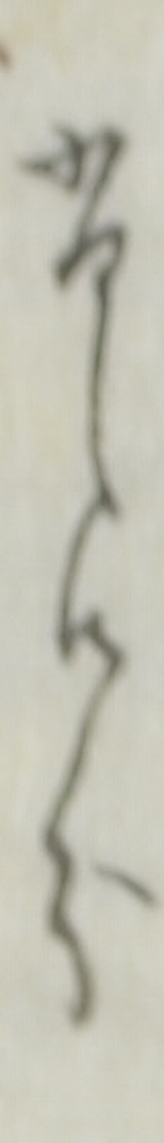有之候分
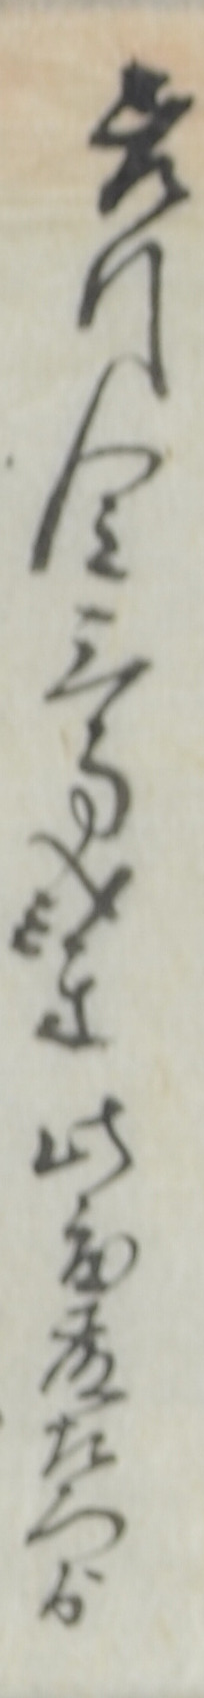差引金三分弐朱此度藤左衛門ゟ

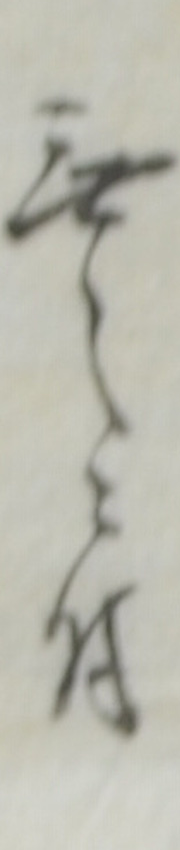無之二付
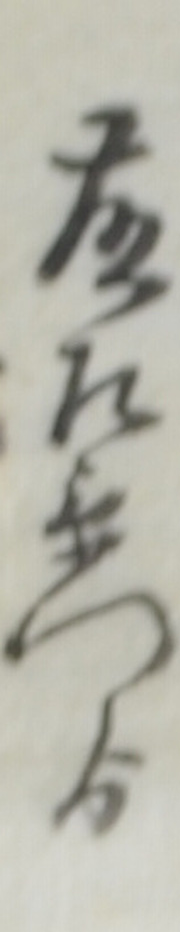藤左衛門ゟ
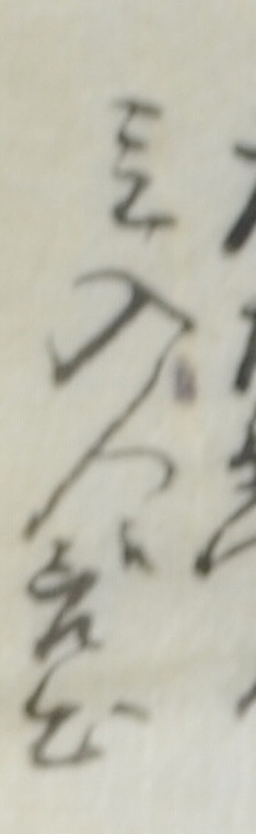立入合差出
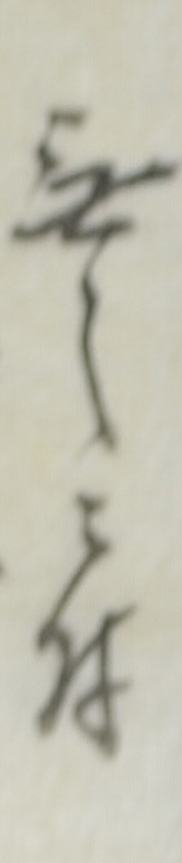無之二付
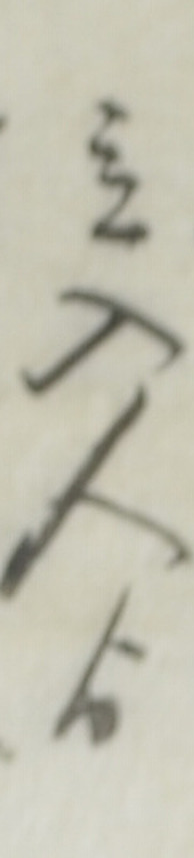立入人ゟ
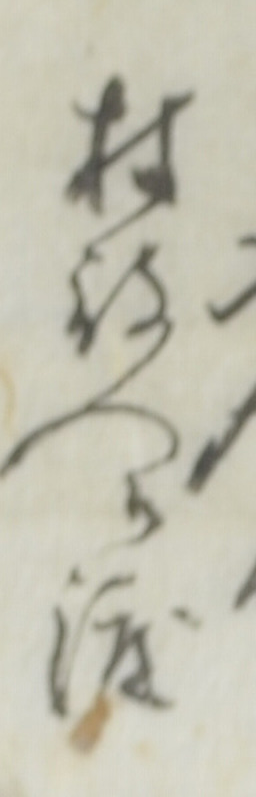村役人へ渡

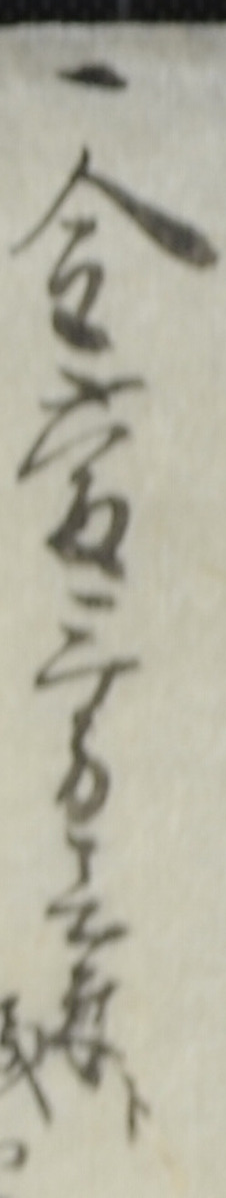一金六両三分一朱
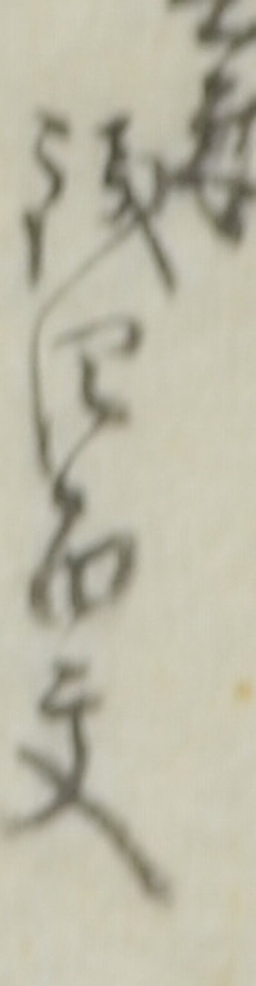銭四百文
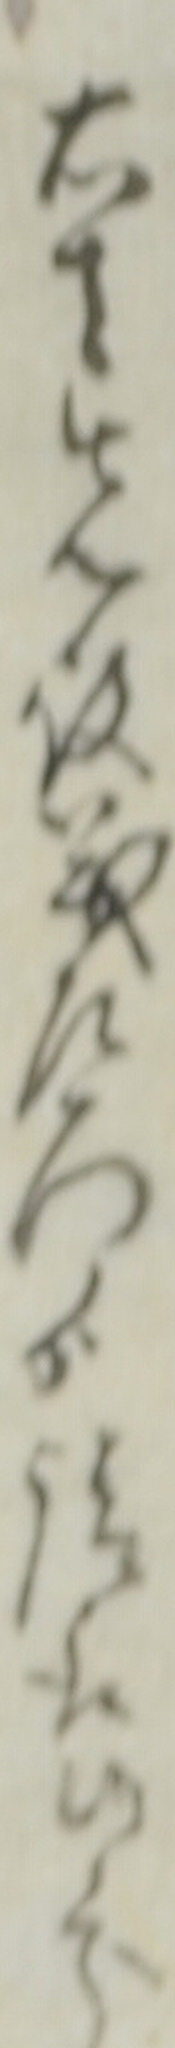右者先役義左衛門ゟ請取候分
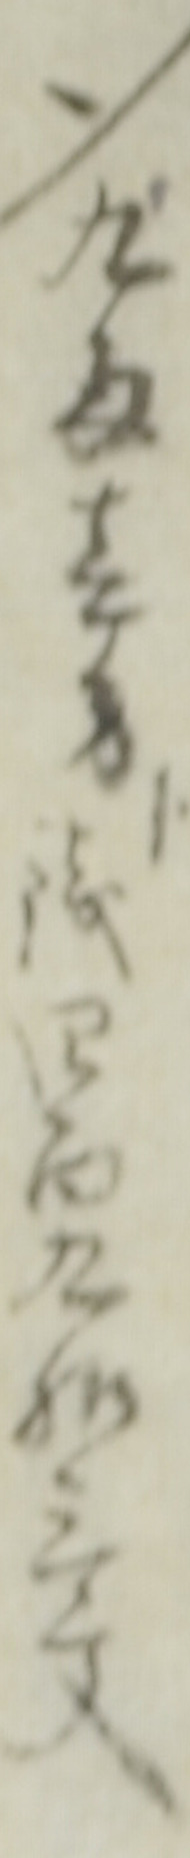〆九匁壱分ト銭四百九拾三文
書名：（金銭勘定抜書）
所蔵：伊那市立高遠町図書館・合同会社AMANE
